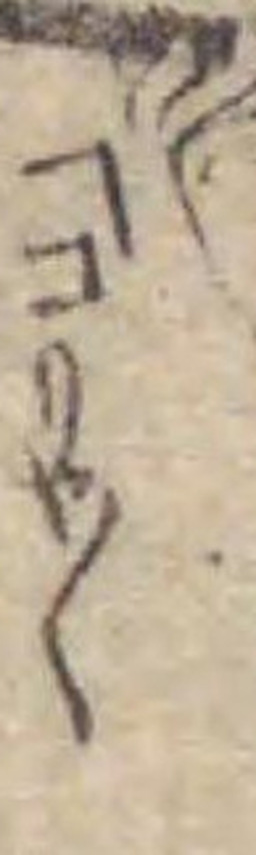〽コリヤ〳〵
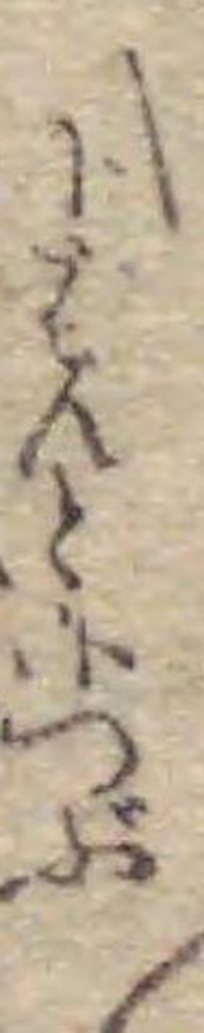〽小ばんと小つぶ
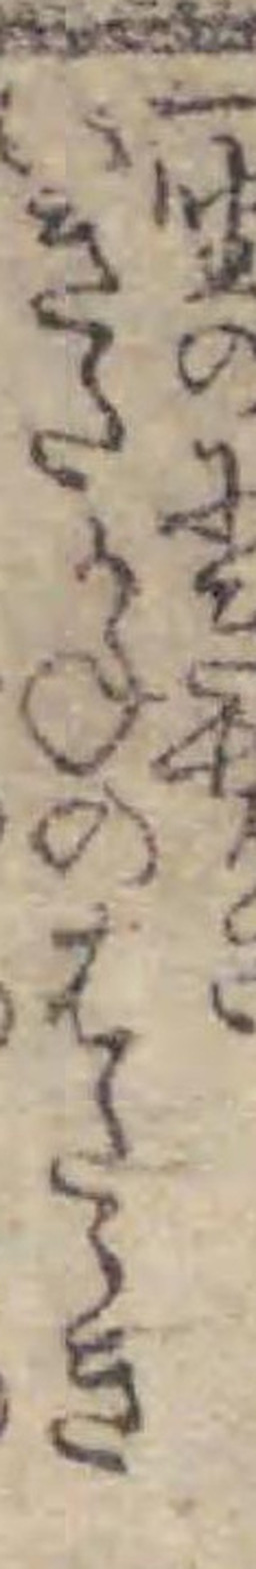いきたかねのはたらき
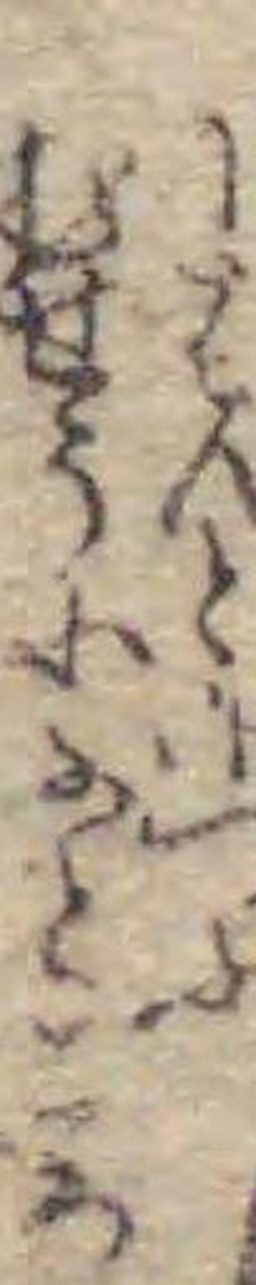むせうにふところ
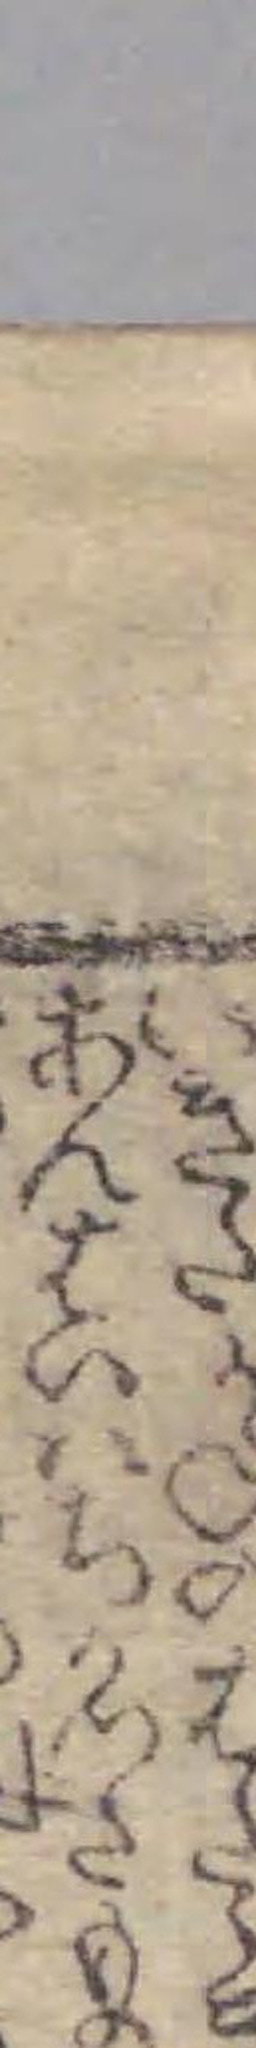あんはいはちかつたもの
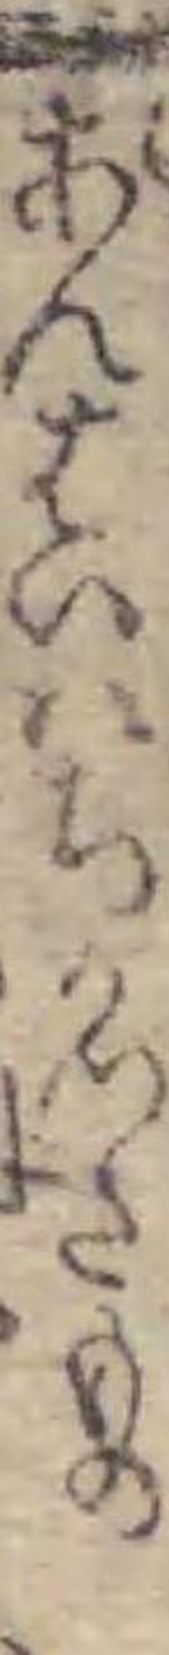あんはいはちかつたもの
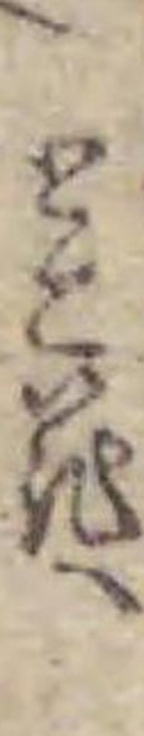とこ花へ
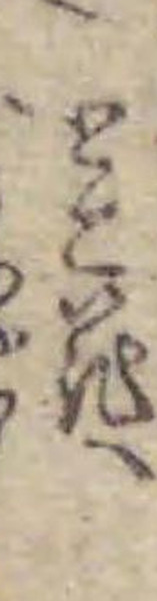とこ花へ
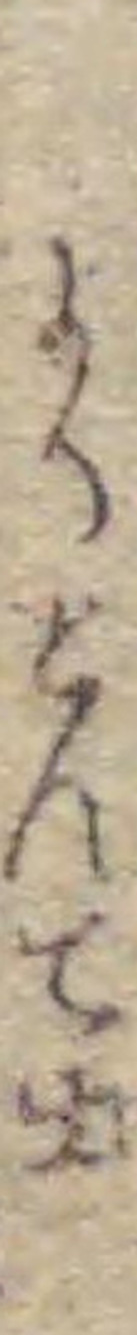よりとんて出
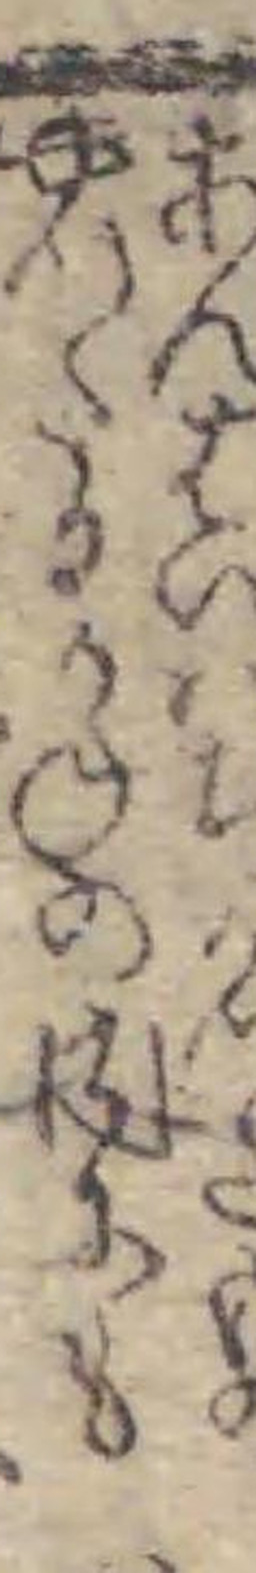やつたるかねの内にも
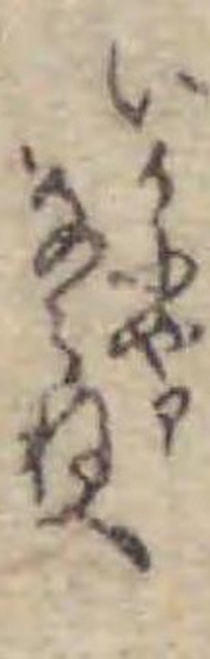ならねへ
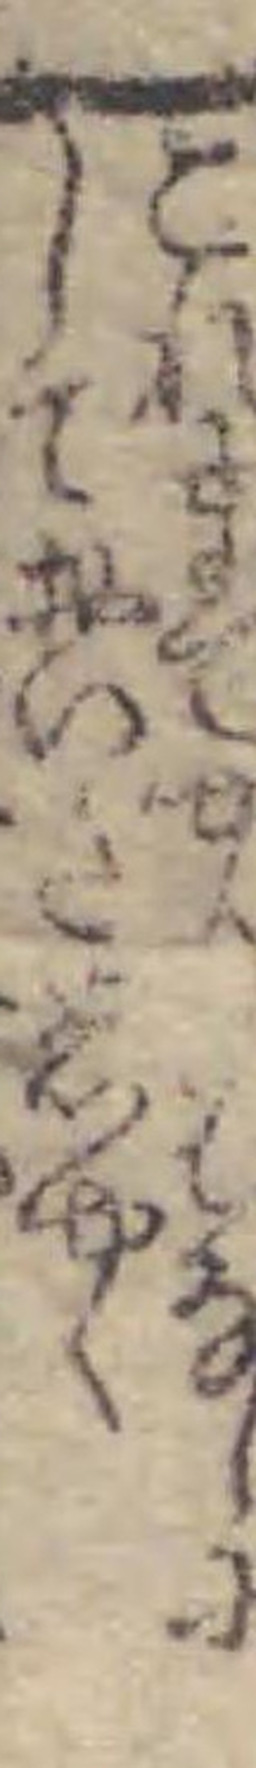しておいたしやく
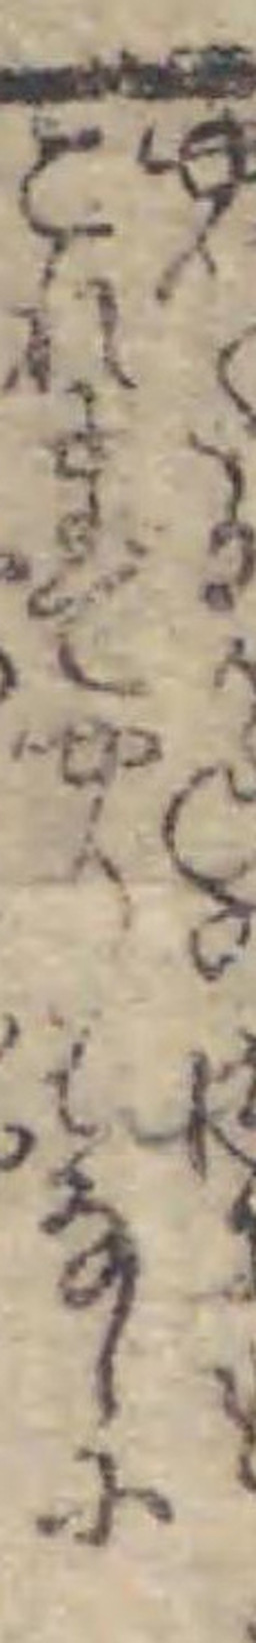これまでやりはなしに
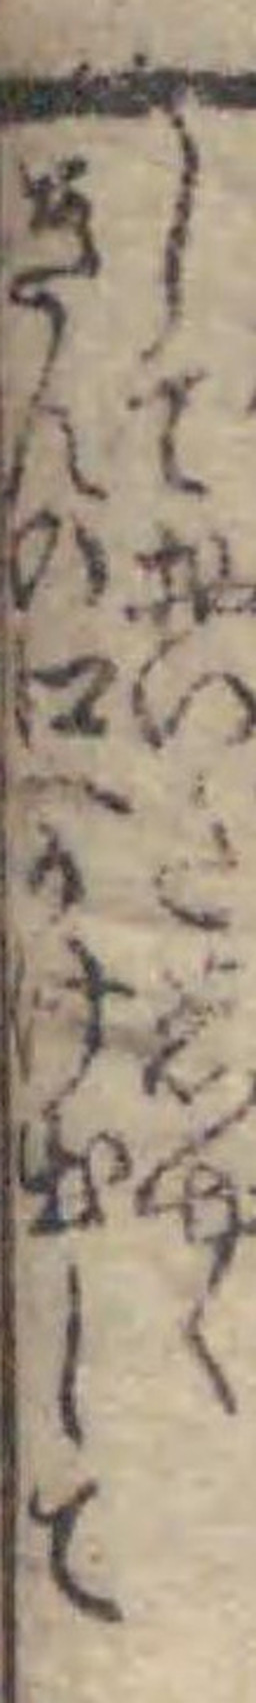きんの口へかけ出して
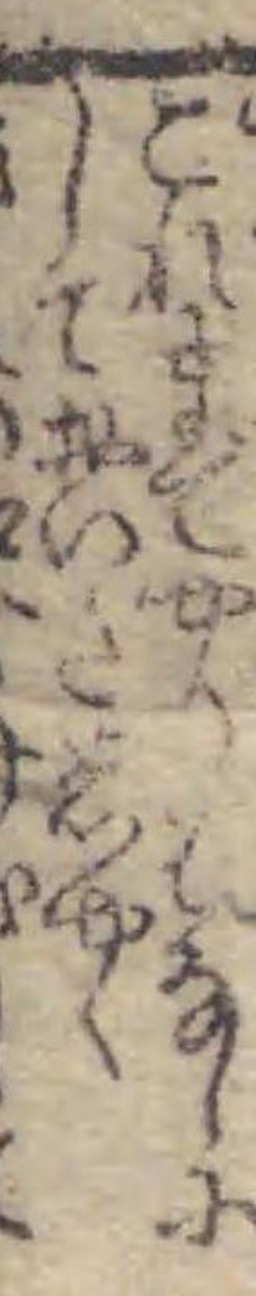しておいたしやく
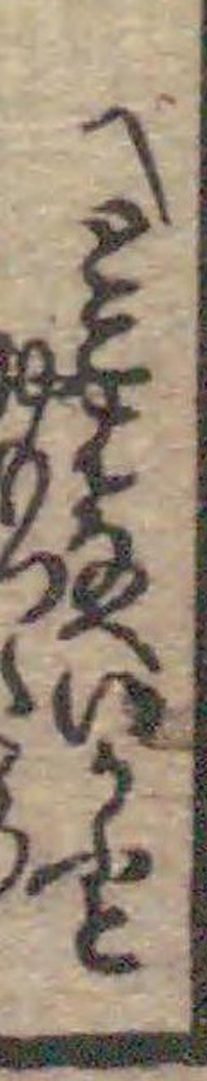〽とこはなへいかふと
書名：新鋳小判 : 3巻
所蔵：国立国会図書館 National Diet Library, JAPAN
